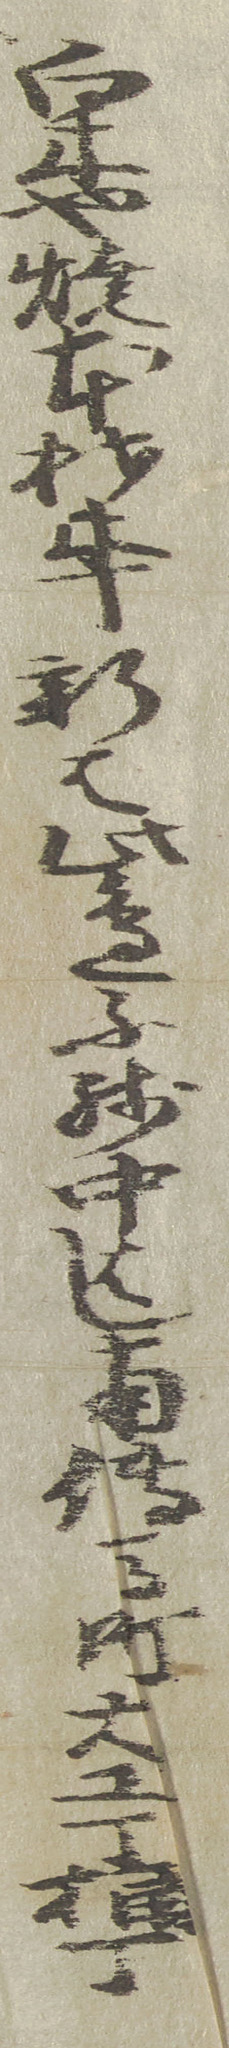白木や焼本材木丁新は此邊不残中はし南傳馬町大工丁桶丁
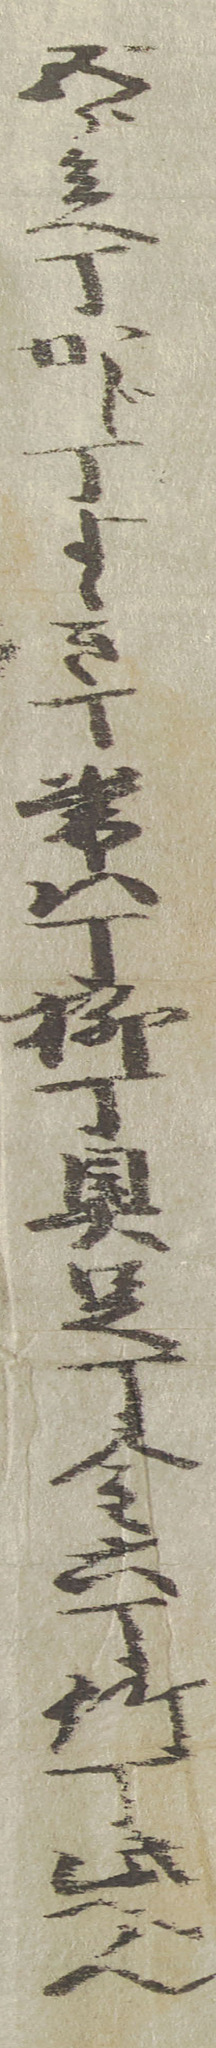五郎兵へ丁かじ丁よゝき丁常ハ丁柳丁具足丁金六丁竹丁此へん
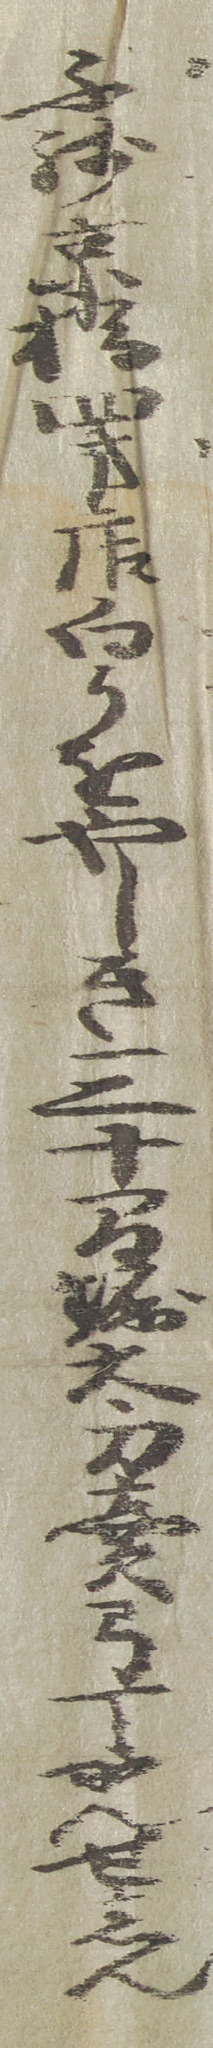不残京橋四方店白うをやしき三十間堀太刀賣弓丁かんせしん
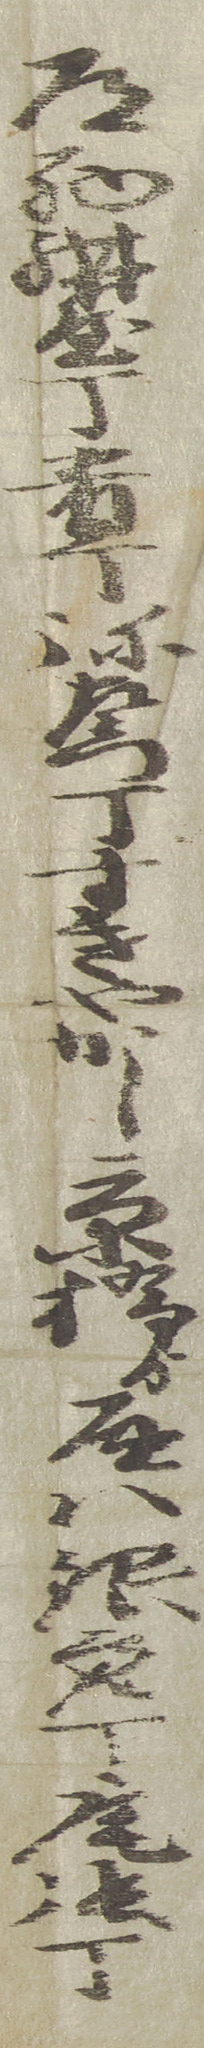道西紺屋丁肴丁弥左衛門丁すきやかし京橋ゟ通ハ銀座丁尾張丁
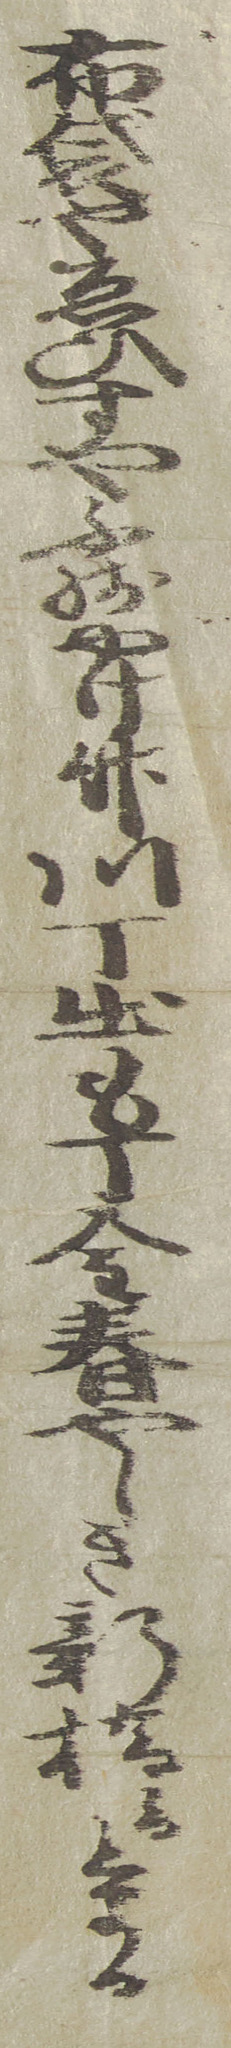布袋やゑひすや不残やけ竹川丁出も丁金春やしき新橋ニ而とまる
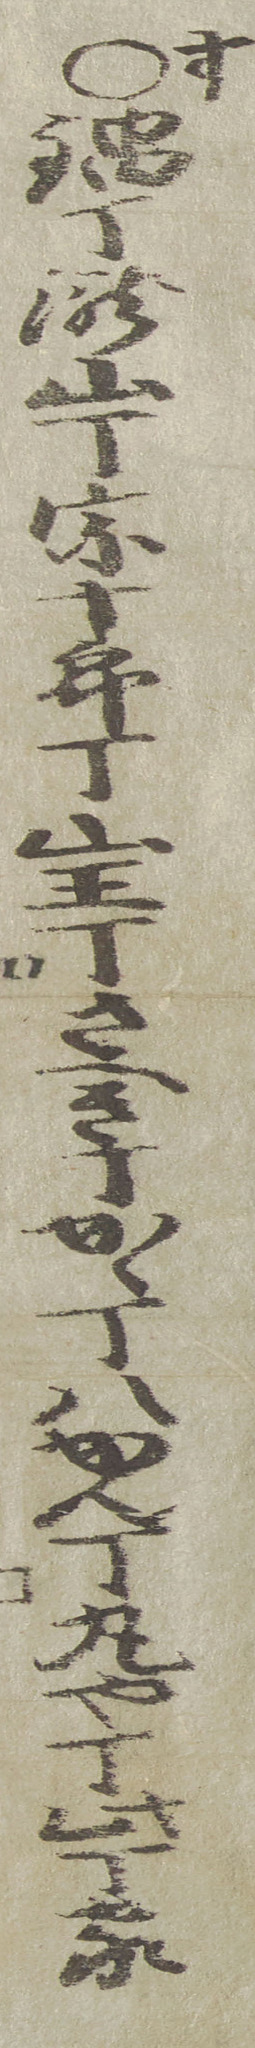◯鍋丁瀧山丁宗十郎丁山王丁さへき丁かゝ丁八かん丁丸や丁此丁家
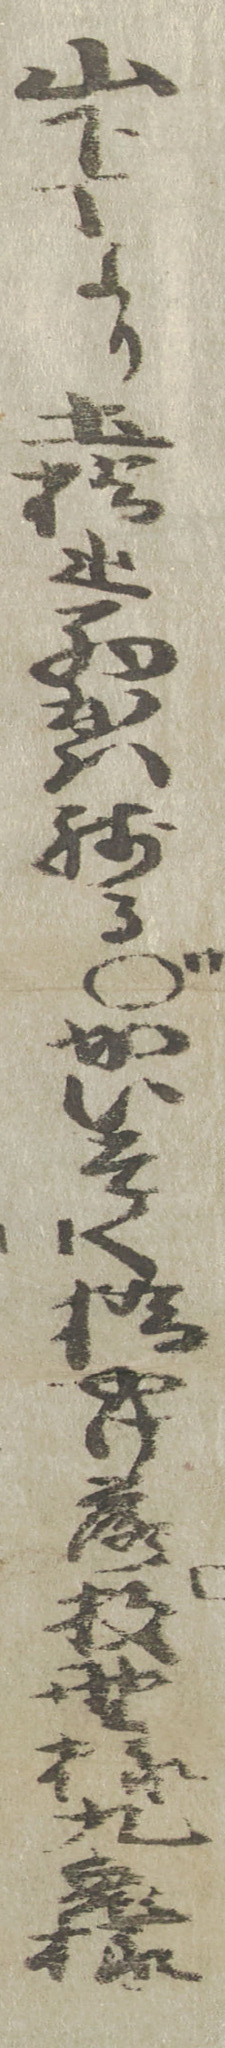山下丁より土橋迄西かハ残る◯かいそく橋やけ落枝野様九鬼様
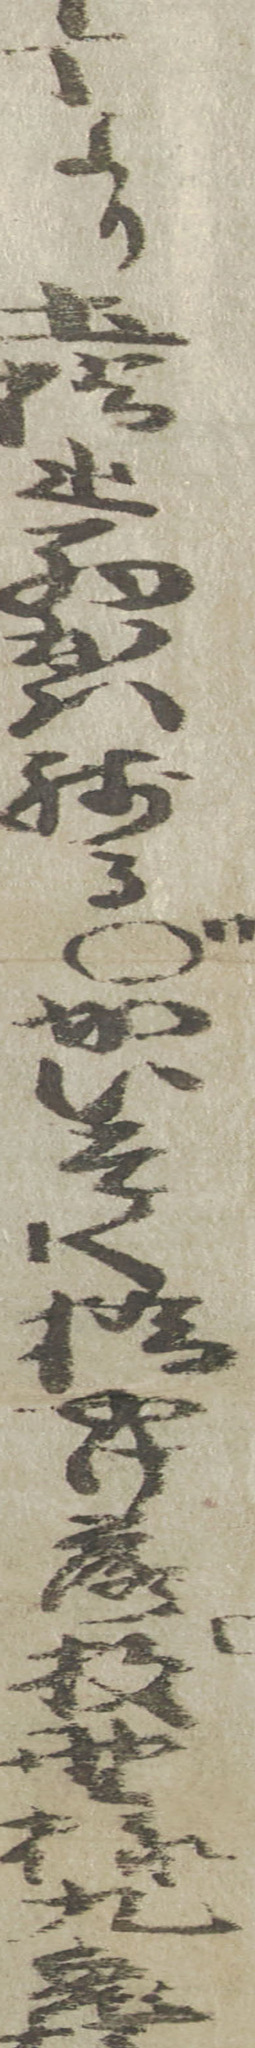山下丁より土橋迄西かハ残る◯かいそく橋やけ落枝野様九鬼様
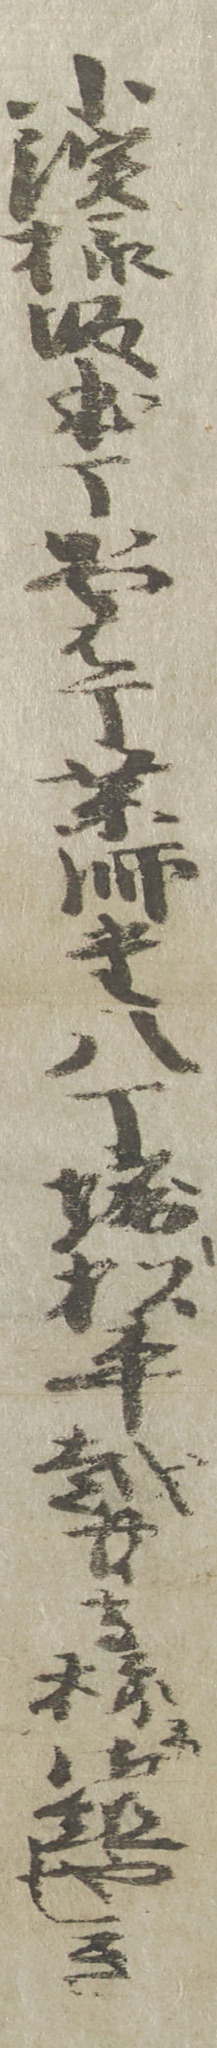小濱様坂本丁かやは丁薬師堂八丁堀松平越前守様御組やしき
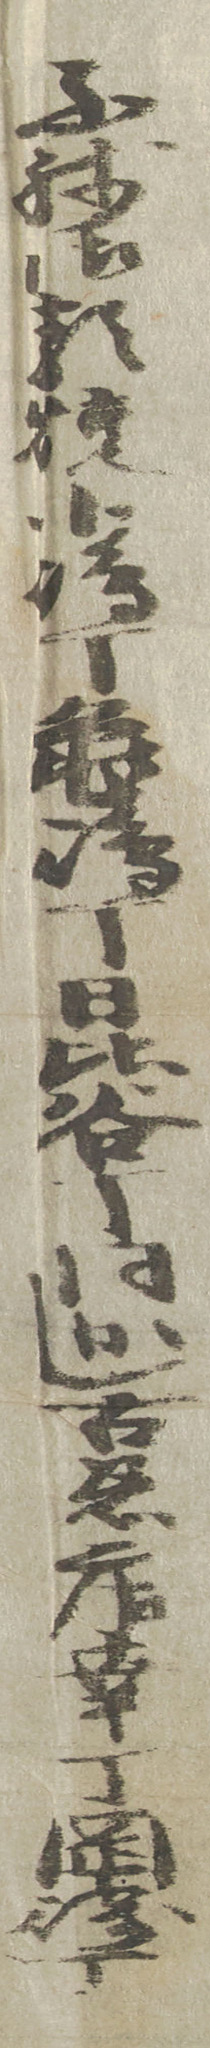不残御類焼小嶋丁亀嶋丁日比谷丁同かし古着店幸丁岡崎丁
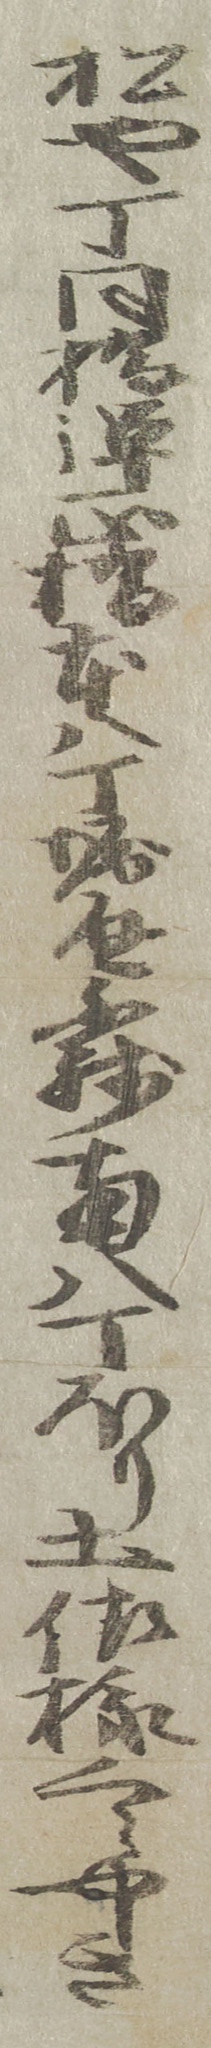松や丁同橋弾正橋本八丁堀通不残南八丁ほり土佐様くらやしき
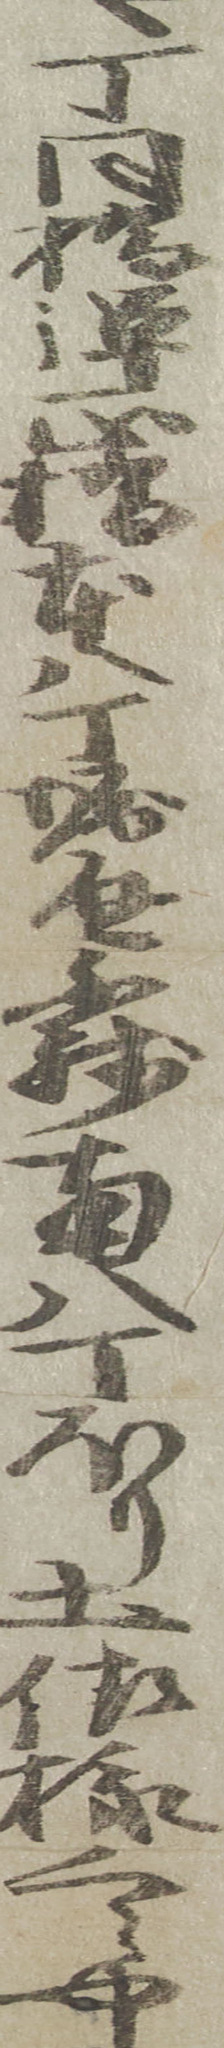松や丁同橋弾正橋本八丁堀通不残南八丁ほり土佐様くらやしき
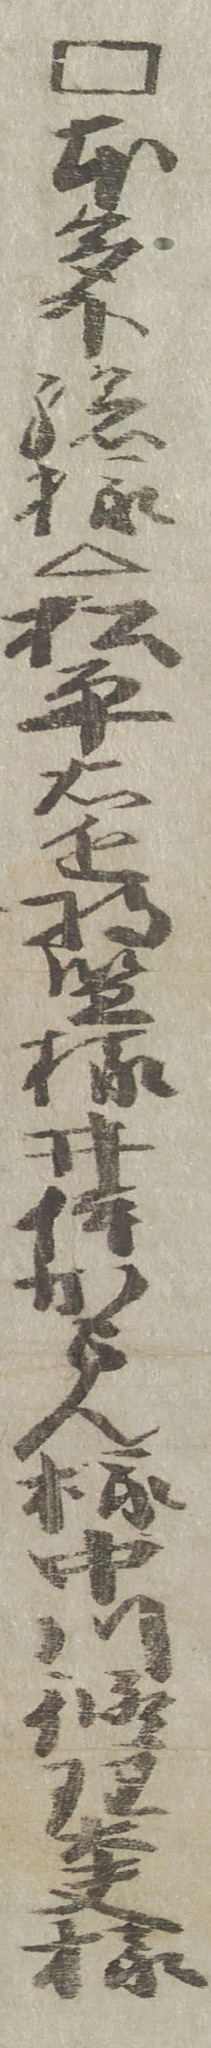本多下総様△松平右近将監様井伊かもん様中川修理大夫様
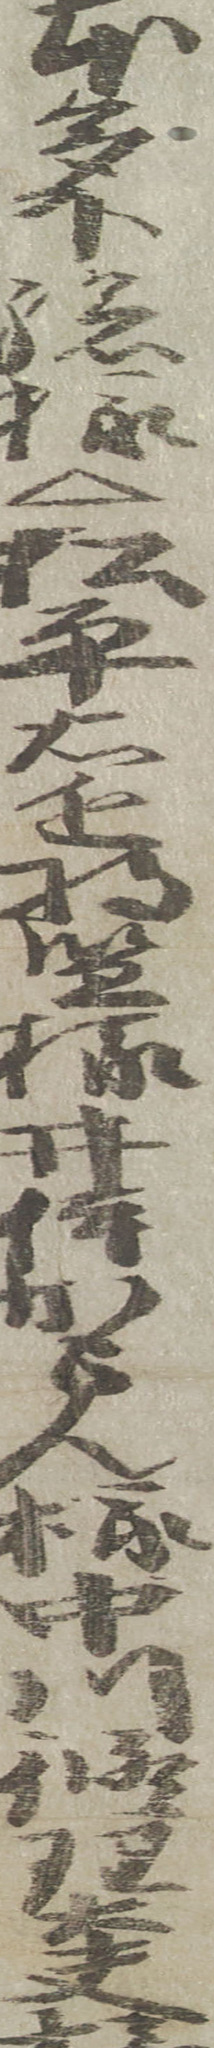本多下総様△松平右近将監様井伊かもん様中川修理大夫様
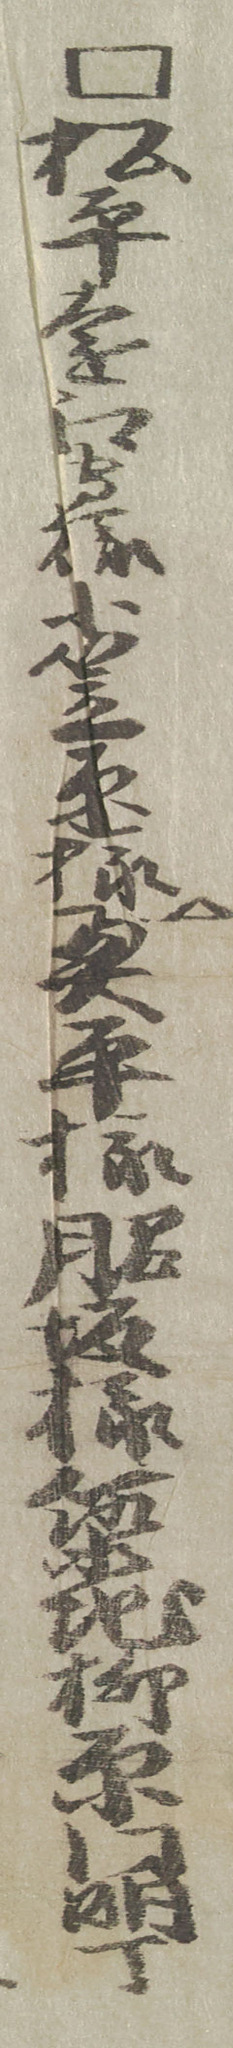松平遠江守様小笠原様△奥平様脇坂様築地柳原同朋丁
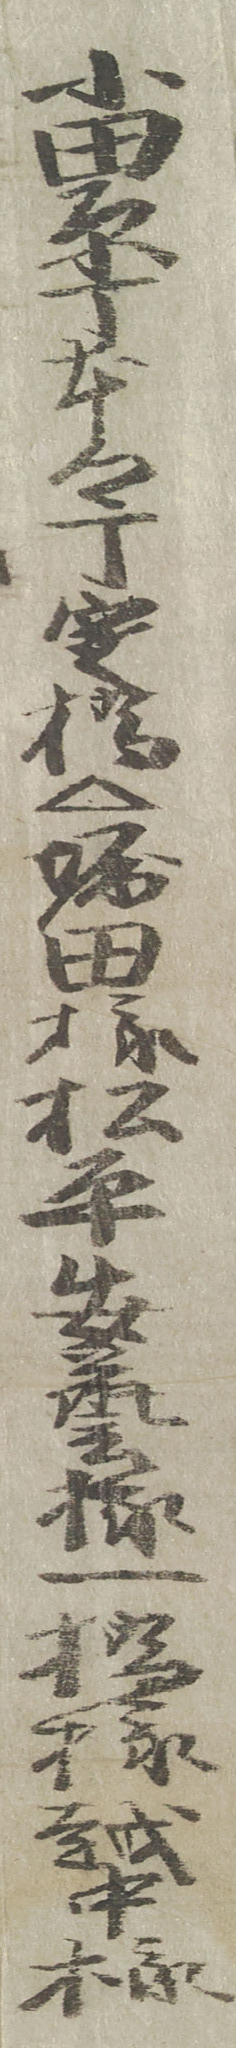小田原丁本郷丁寒橋△堀田様松平安藝様一橋様越中様
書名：方角場所附 [江戸大火]
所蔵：東京大学総合図書館 General Library in the University of Tokyo, JAPAN
